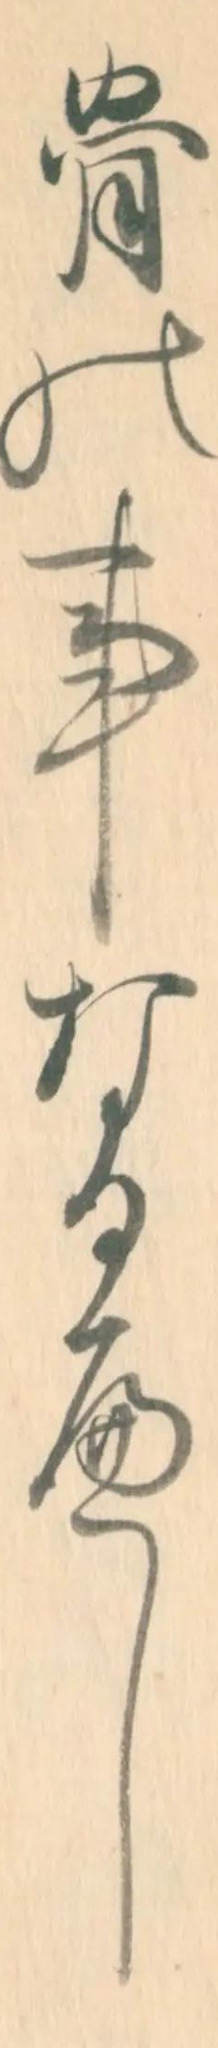骨の事なるへし
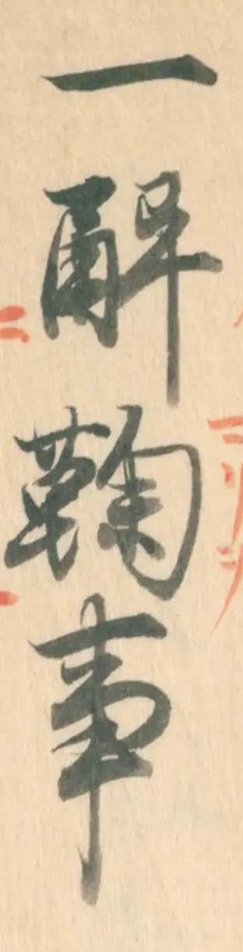一酔鞠事

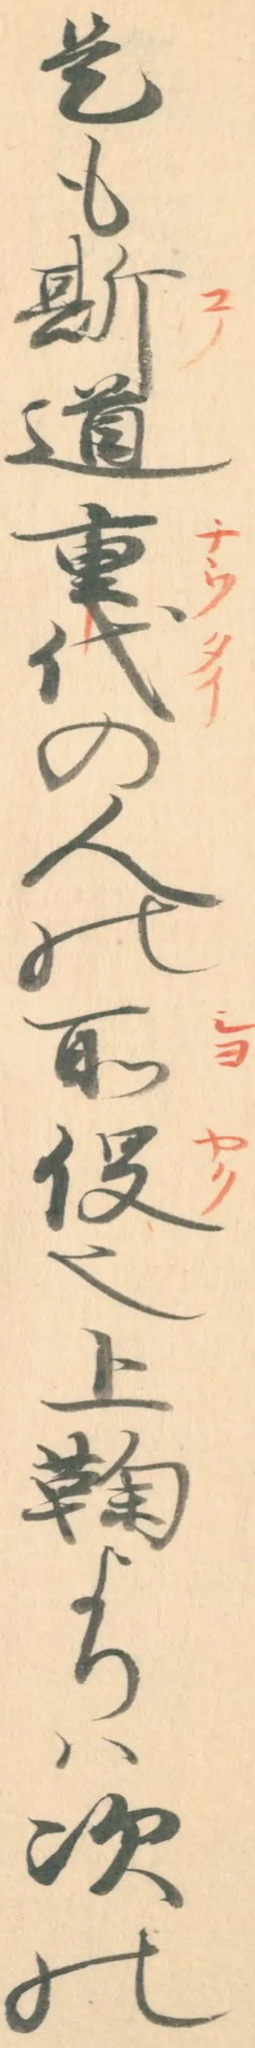是も斯道重代の人の所役也上鞠よりは次の
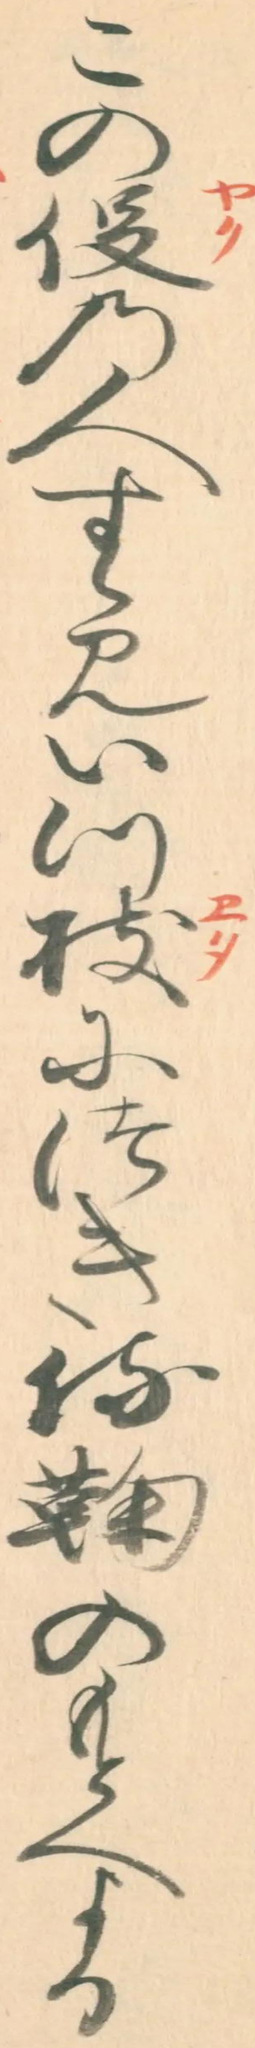この役の人すゝみいつ枝につき侍鞠のもとへよる
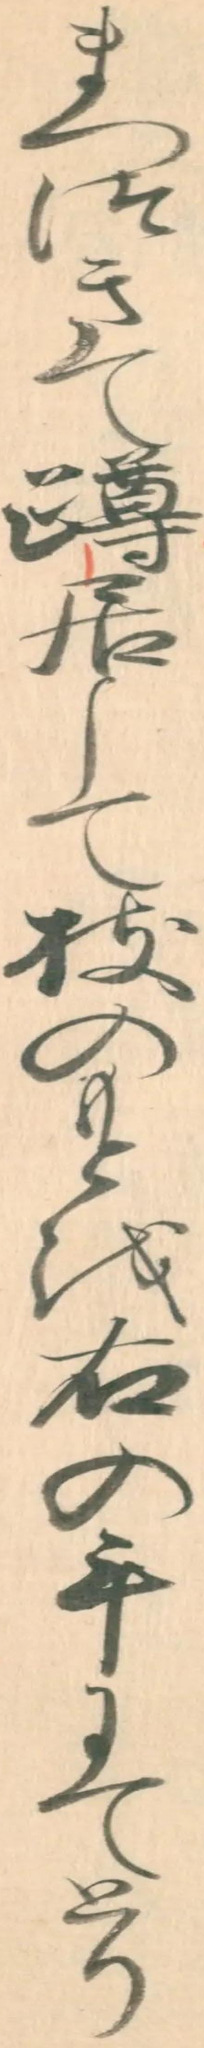まつつきて蹲居して枝のもとを右の手にてとり
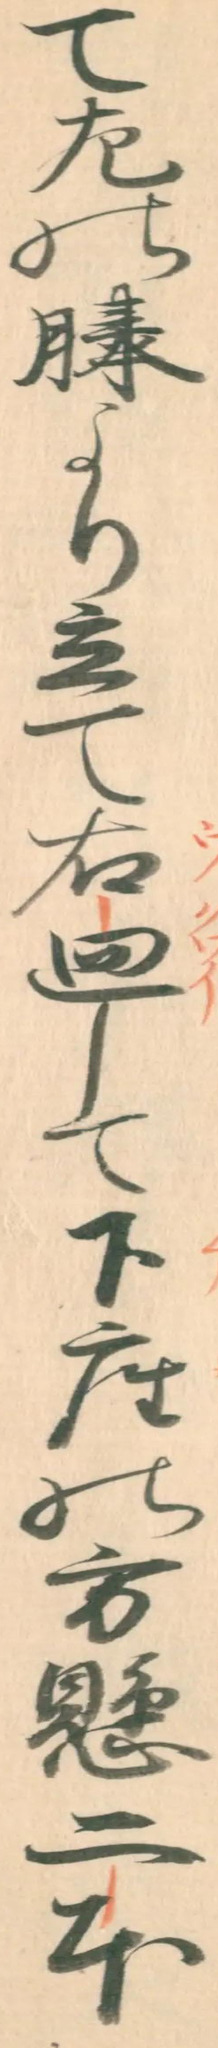て左の膝より立て右回して下座の方懸二本
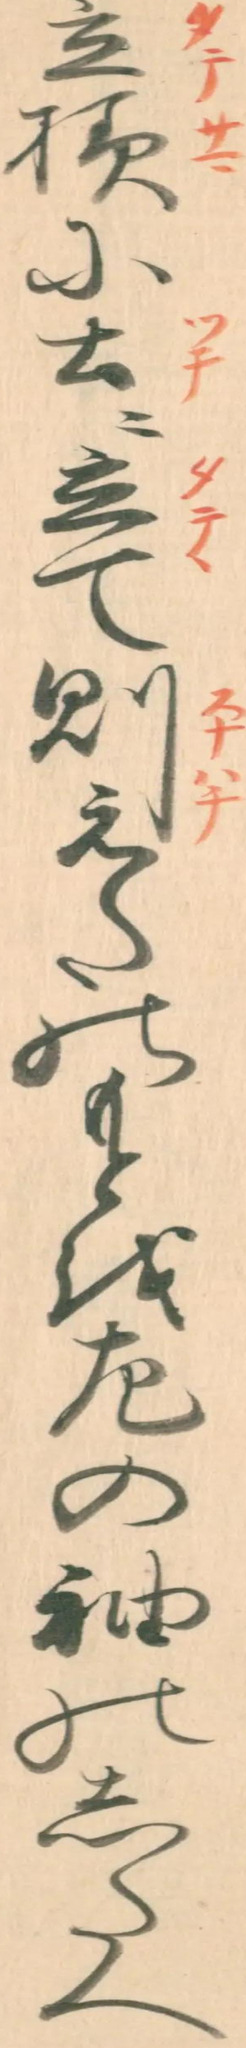立様に土に立て則えたのもとを左の袖のしたへ
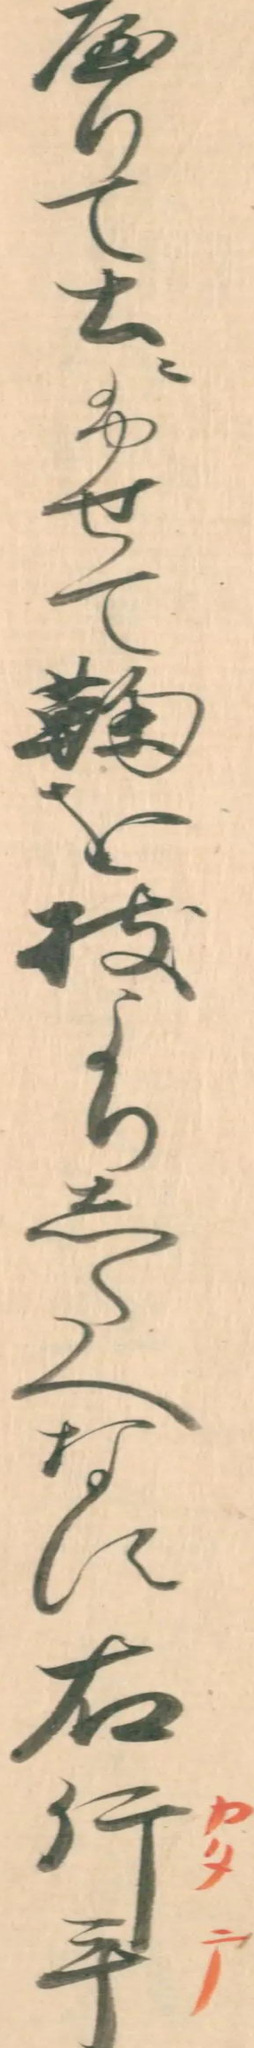やりて土にふせて鞠を枝よりしたへなす右片手
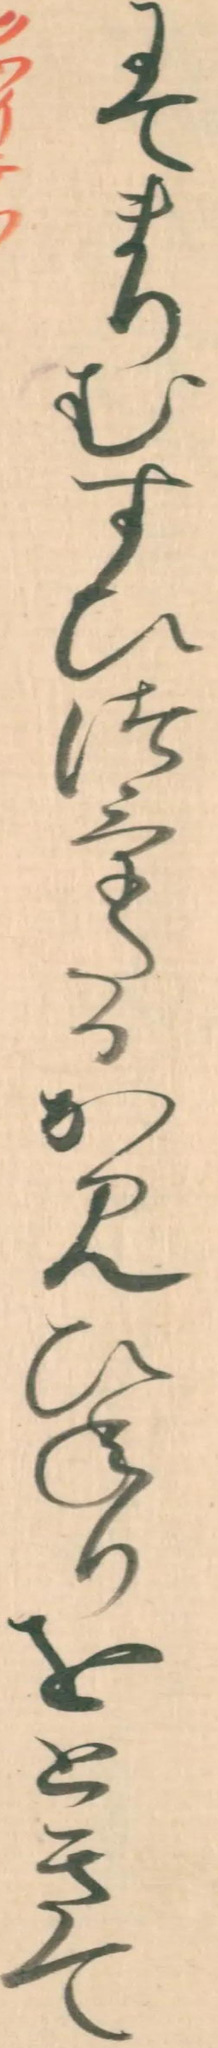にてまりむすひつけたるかみひねりをときて
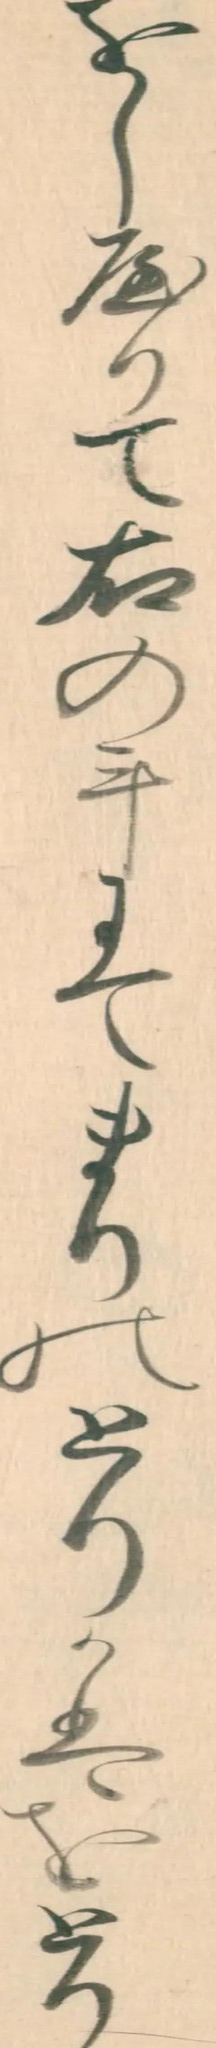をしやりて右の手にてまりのとりかはをとり
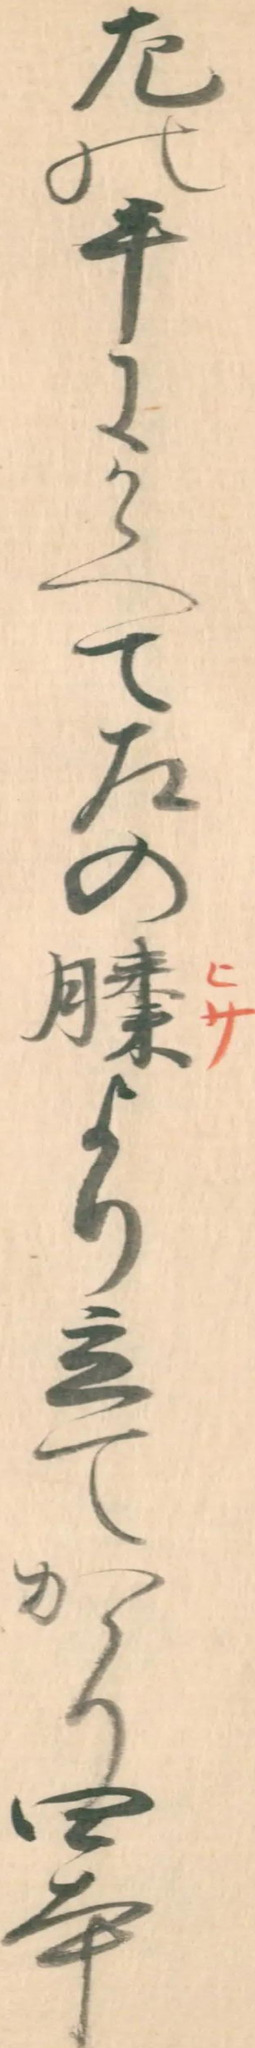左の手にからへて左の膝より立てかゝり四本
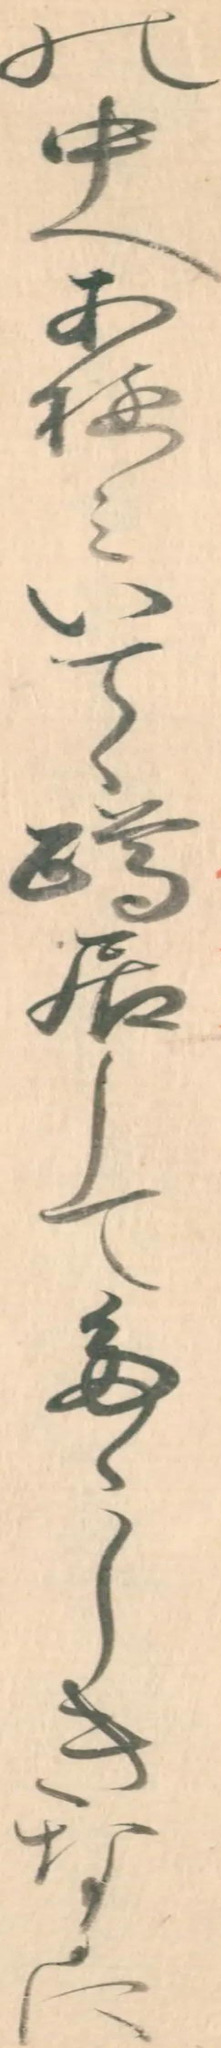の中へあゆみいてゝ蹲居してたゝしきなるに
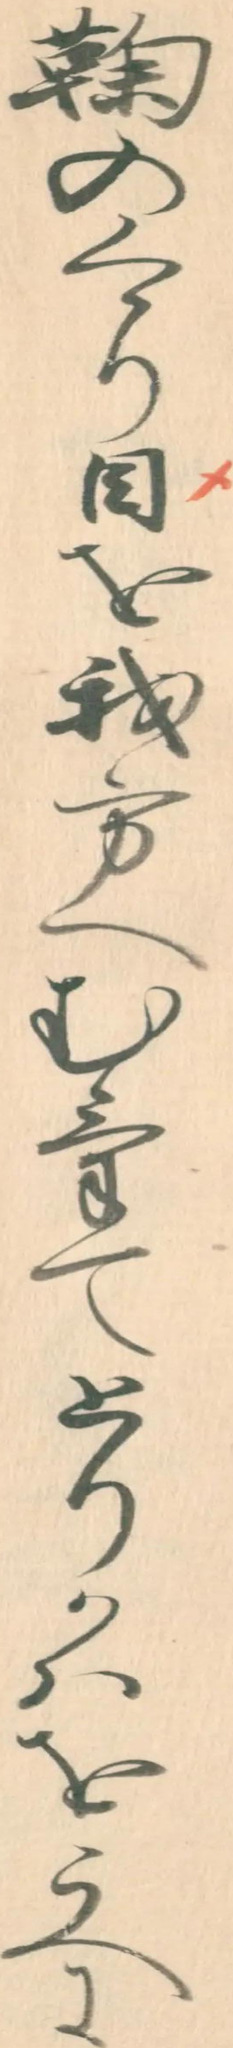鞠のくゝり目を我方へむけてとりかはをうへに
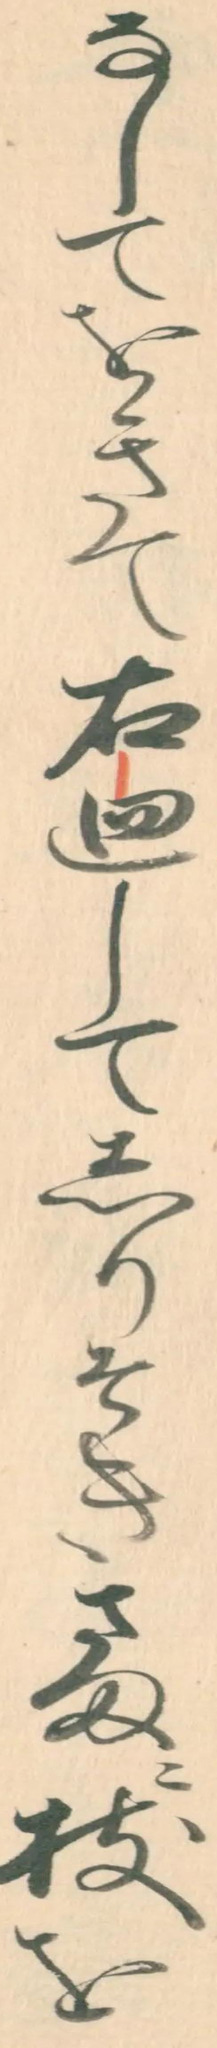なしてをきて右廻してしりそきさまに枝を
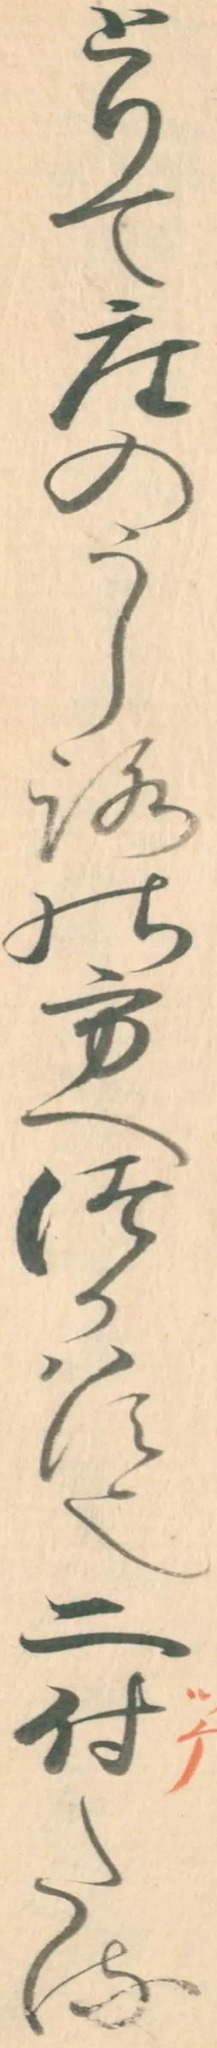とりて左のうしろのほうへつかはす也二付たる
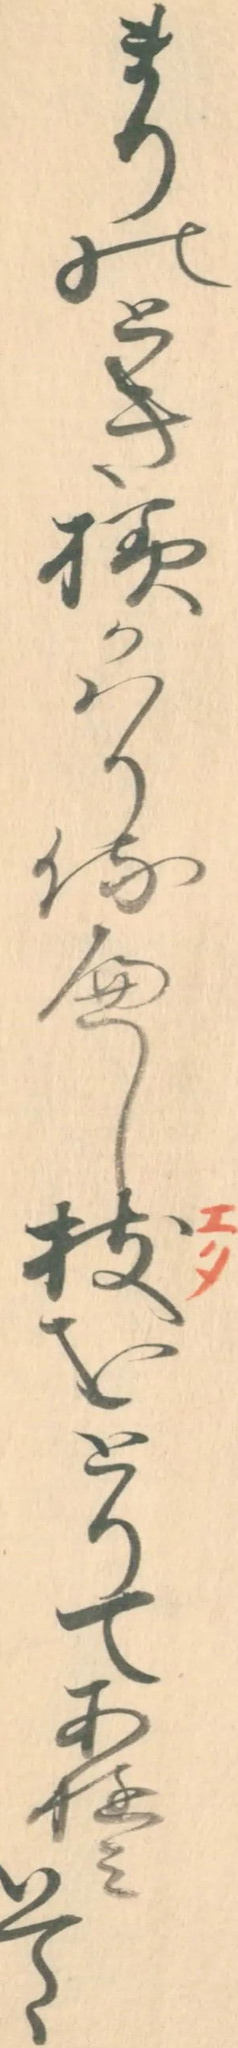まりのとき様かはりにへし枝をとりてあゆみ
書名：遊庭秘抄 2巻. [1]
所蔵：国立国会図書館 National Diet Library, JAPAN
